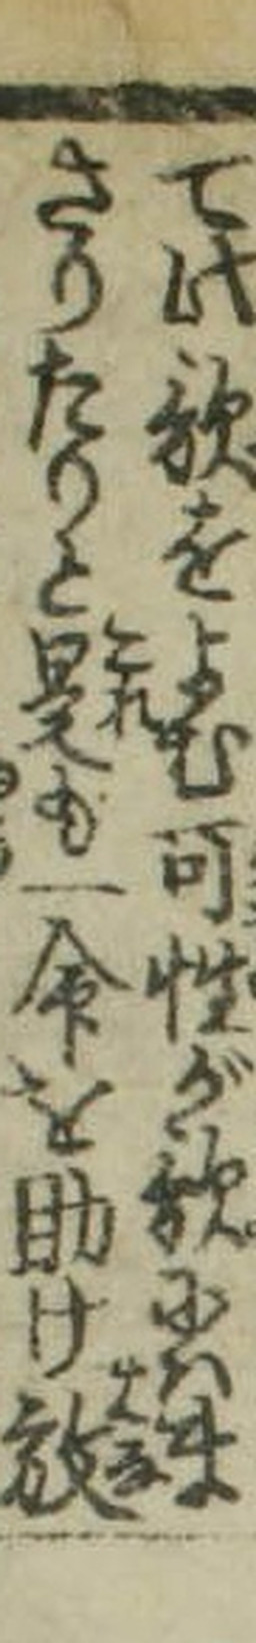さりたりと是も一命を助け放
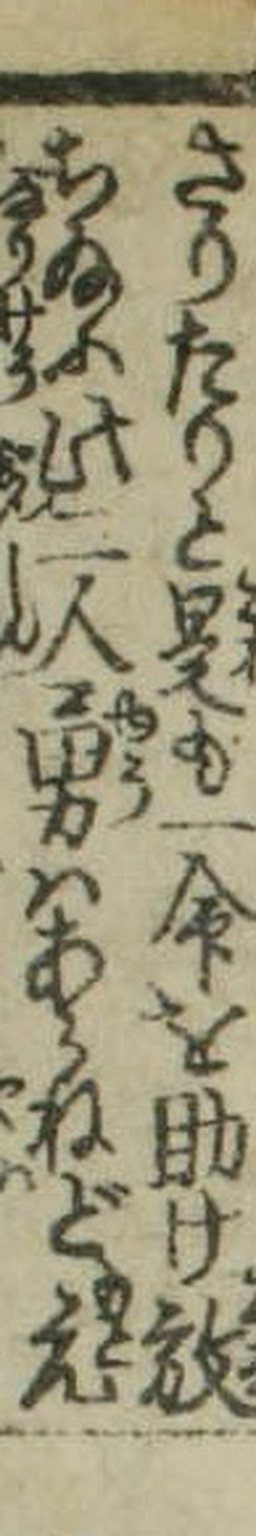ち給ふ此二人勇はあらねど元
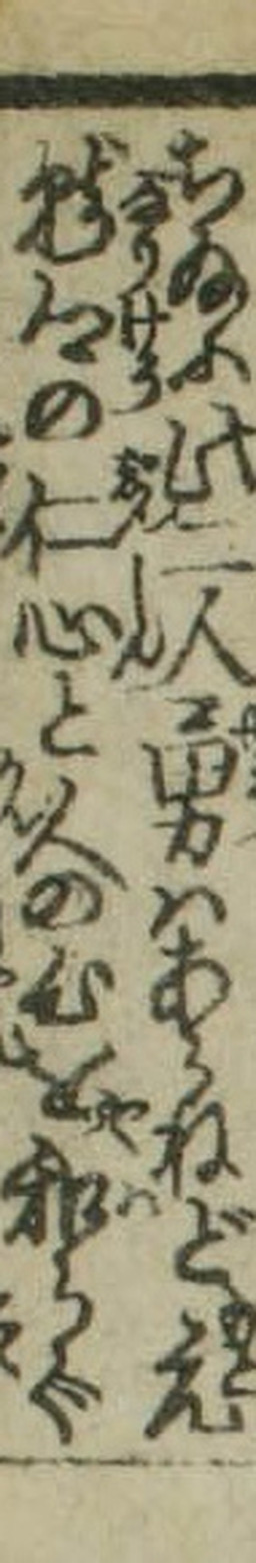就卿の仁心と人の心を和らぐ
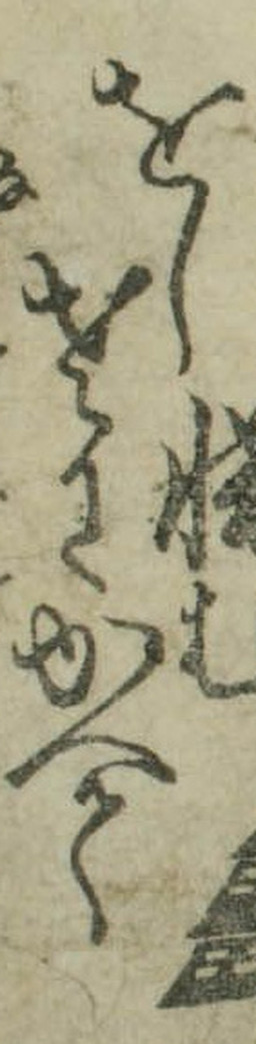さにかへて
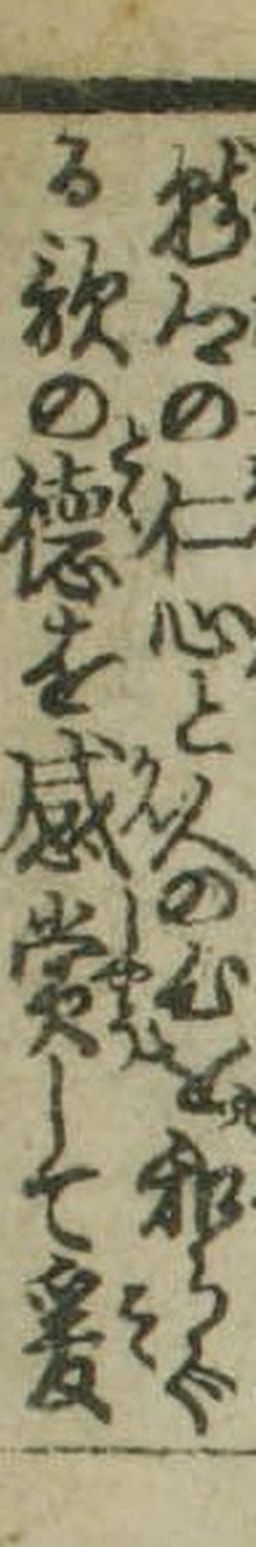る歌の徳を感賞して爰
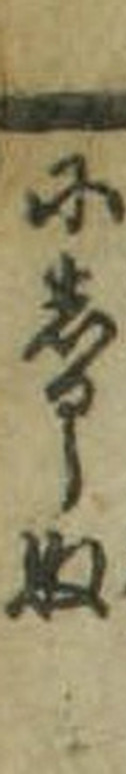にしるしぬ
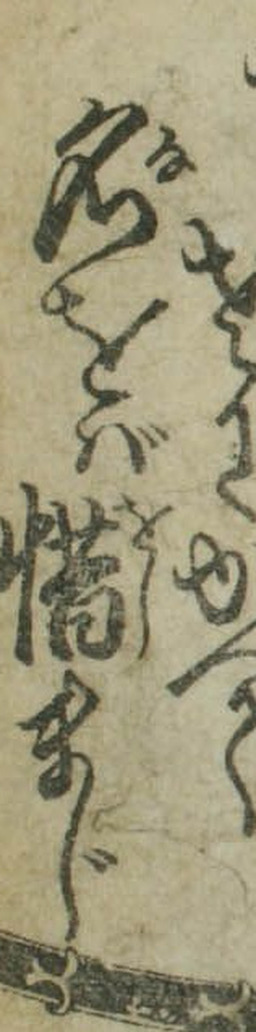名をば惜まじ

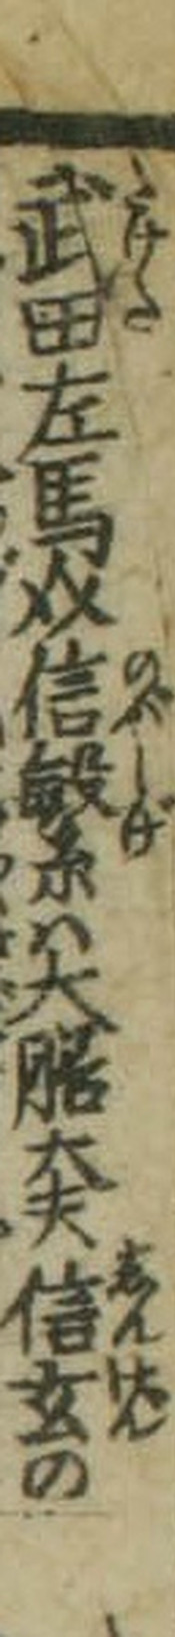武田左馬介信繁は大膳大夫信玄の
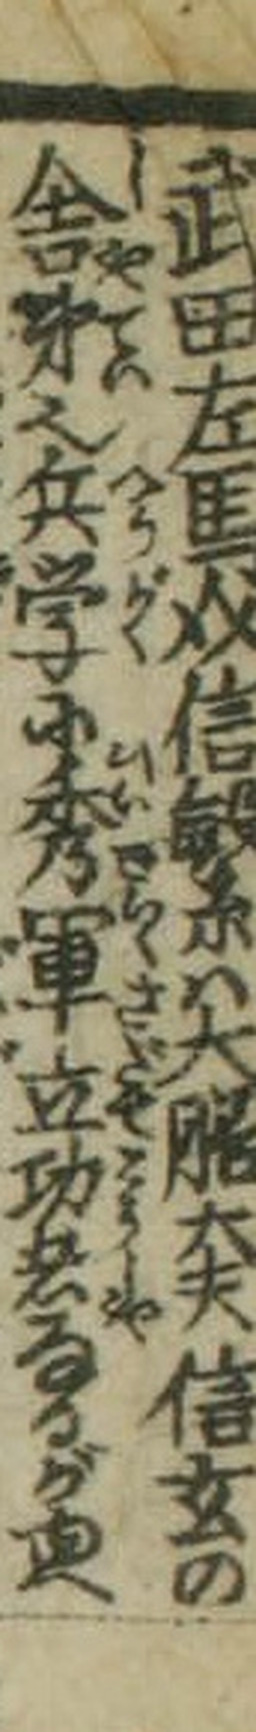舎弟也兵学に秀軍立功者なるがゆへ
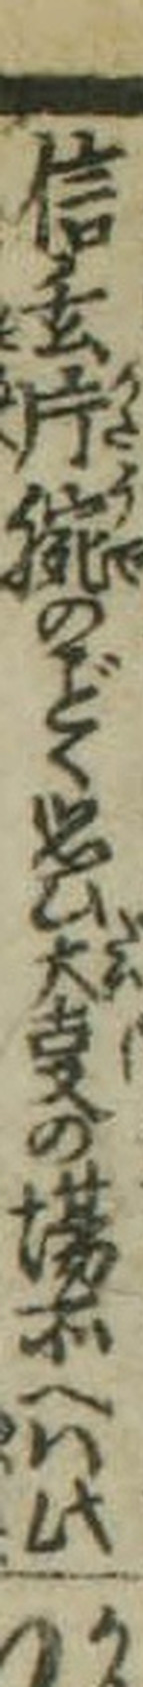信玄片腕のごとく思ひ大事の場所へは此
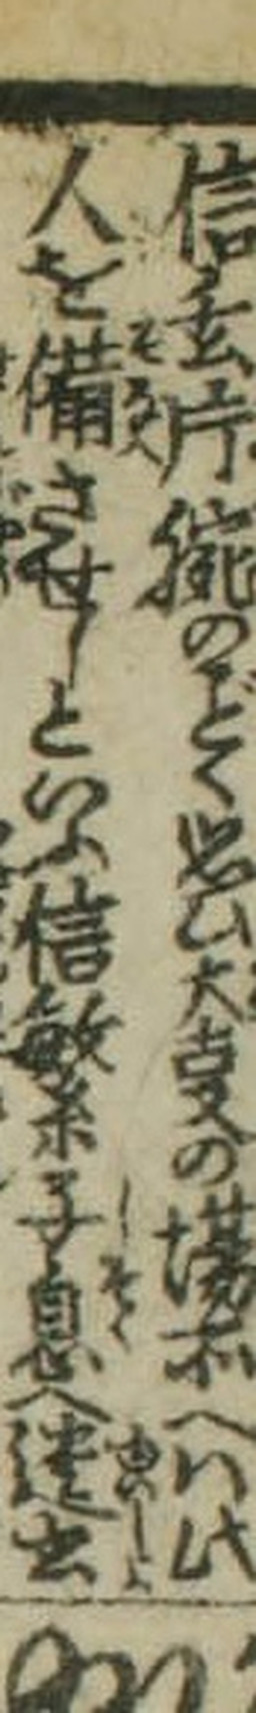人を備させしといふ信繁子息へ遺書
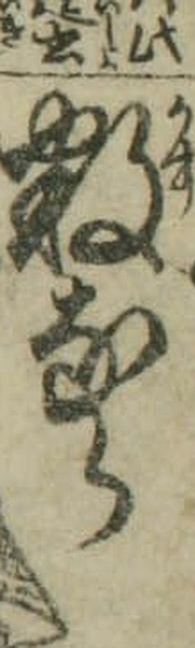数なら
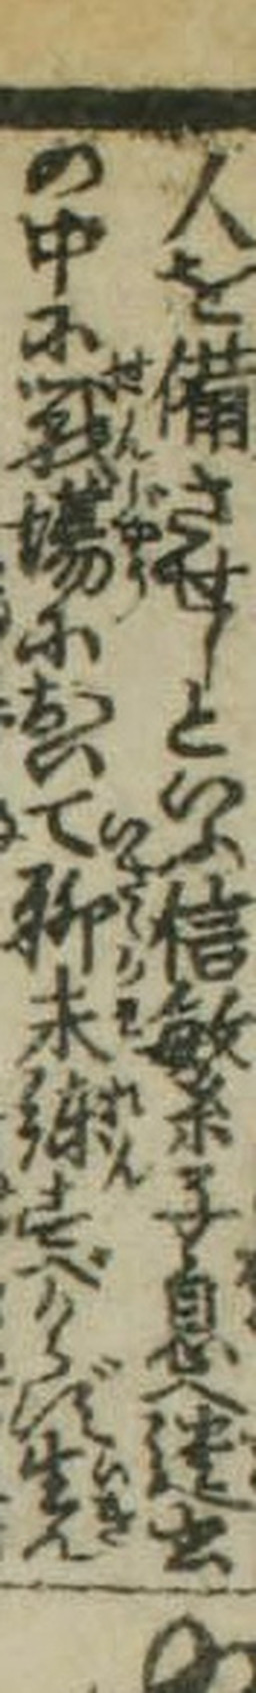の中に戦場において聊未練すべからず生ん
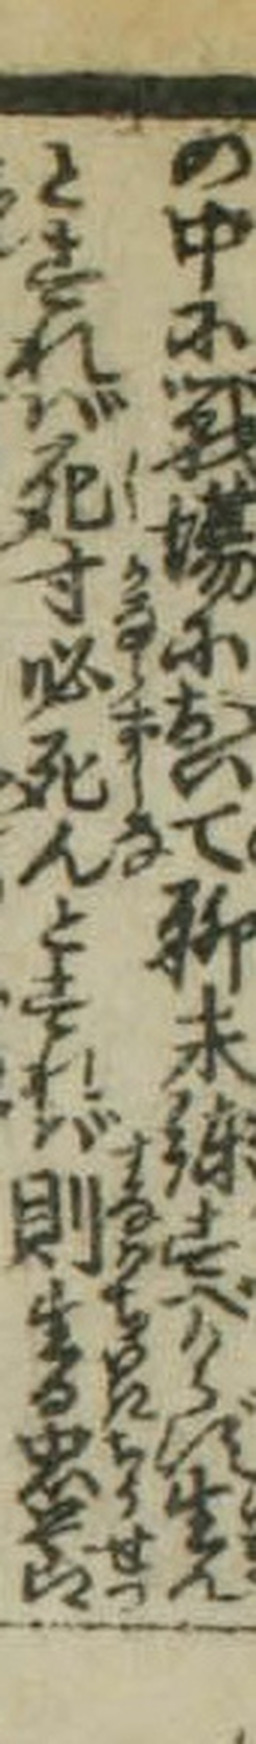とすれば死す必死んとすれば則生る忠節
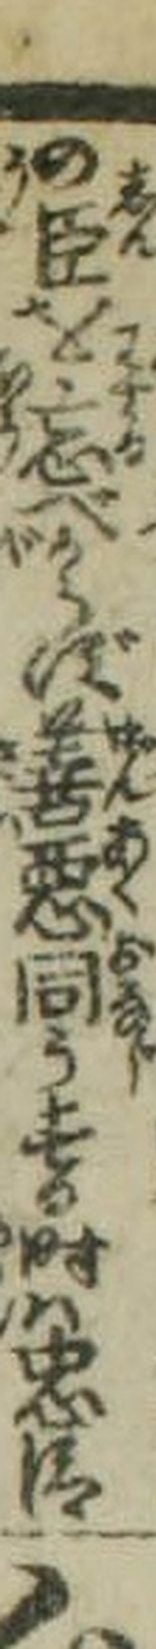の臣を忘べからず善悪同うする時は忠臣
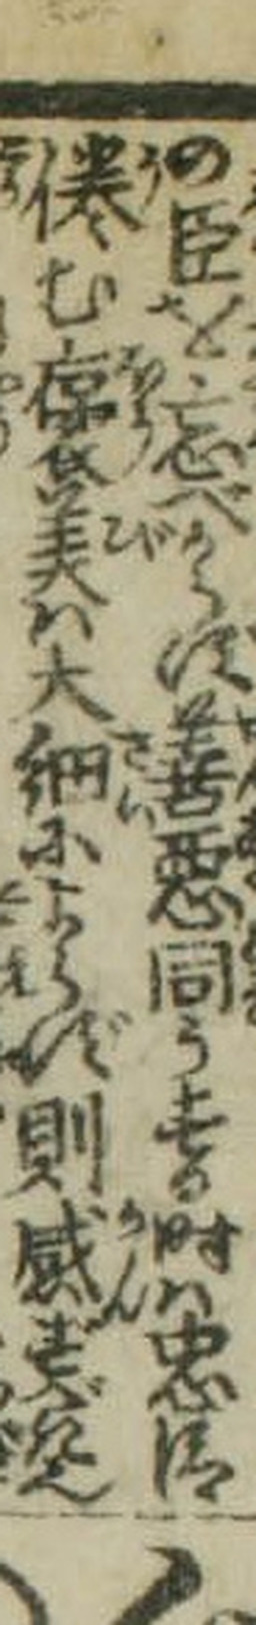倦む褒美は大細によらず則感ずべき也
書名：續英雄百人一首
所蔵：東京学芸大学附属図書館
